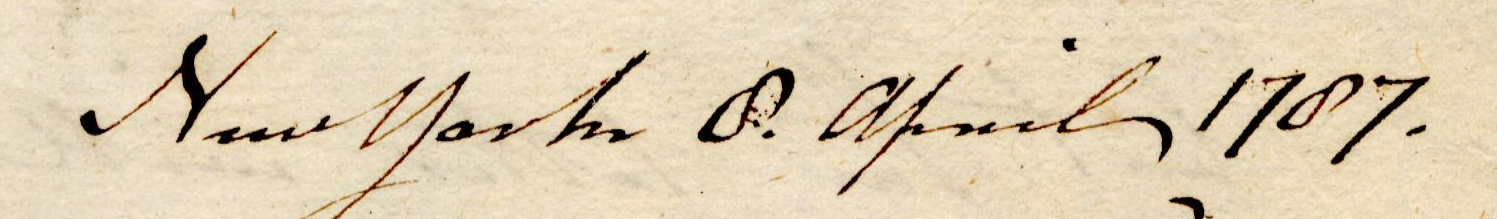New York 8. April 1787.
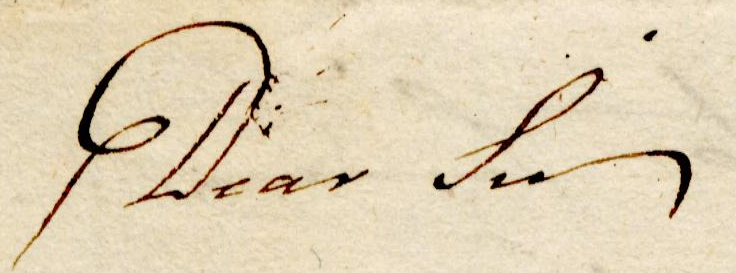Dear Sir
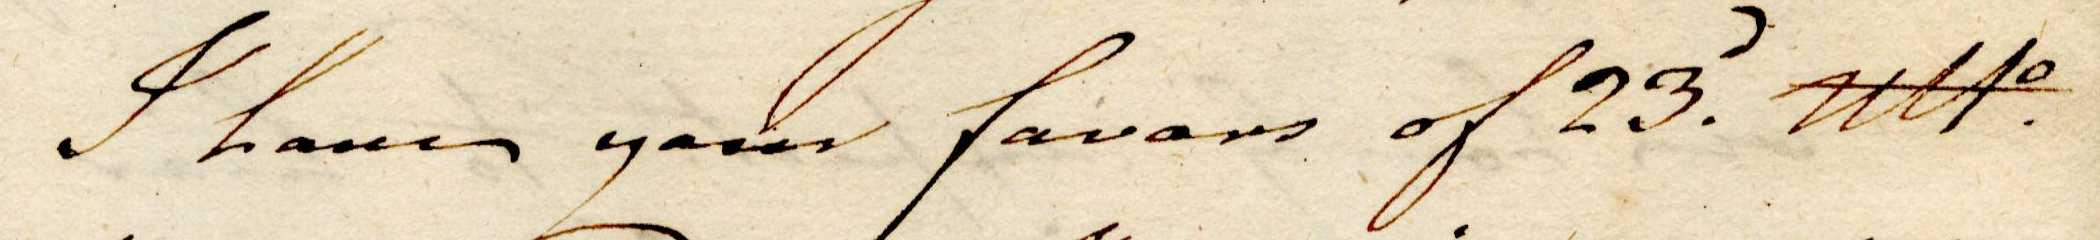I have your favors of 23^d Ult^o.
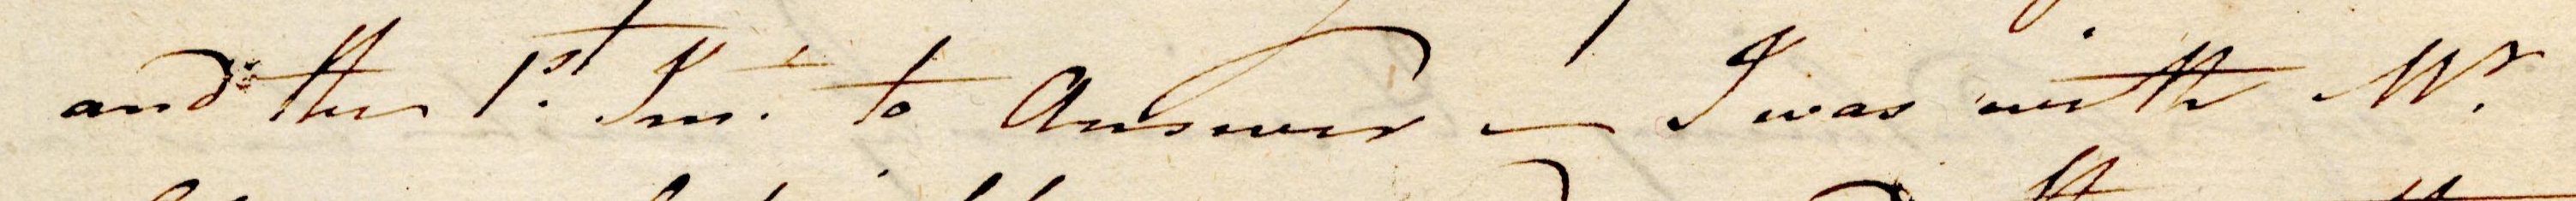and the 1^st. Ins^t. to Answer- I was with M^r.
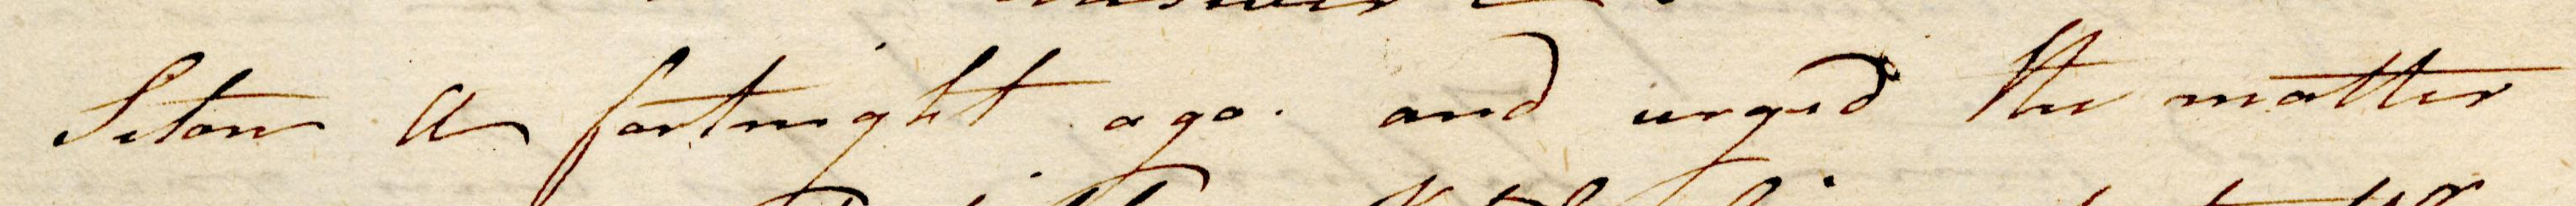Seton a fortnight ago. and urged the matter
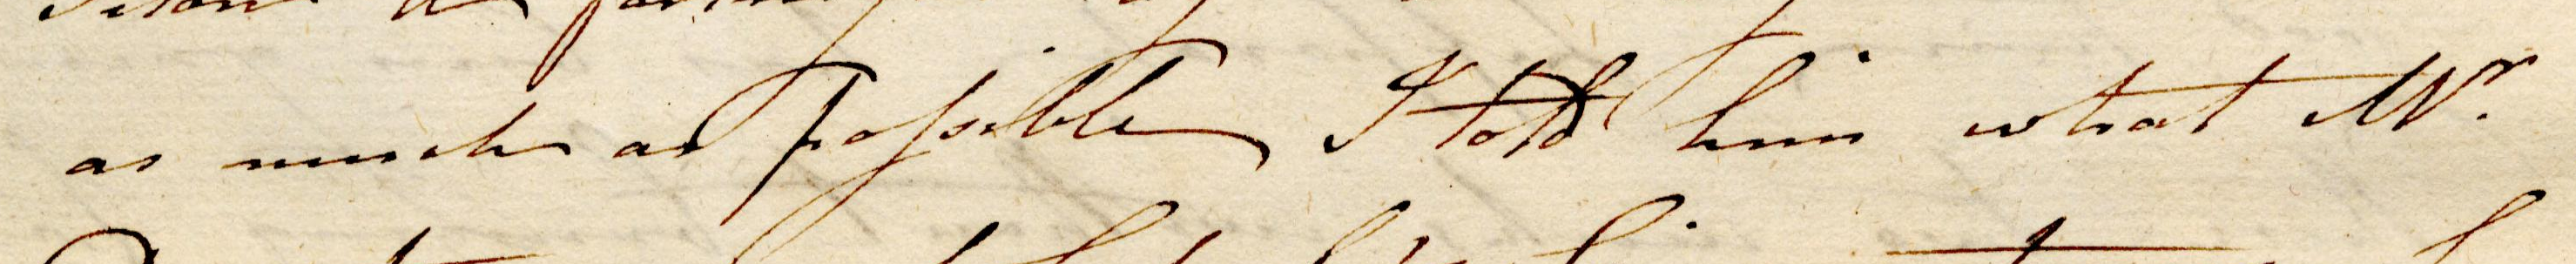as much as possible, I told him what M^r.
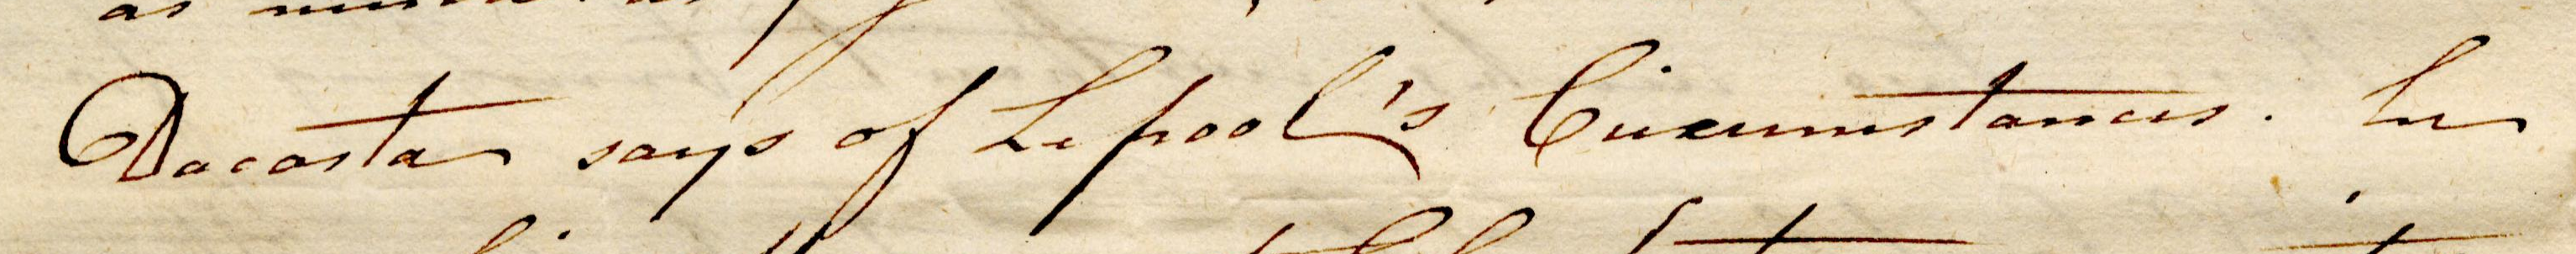Dacosta says of Lepool's Circumstances he
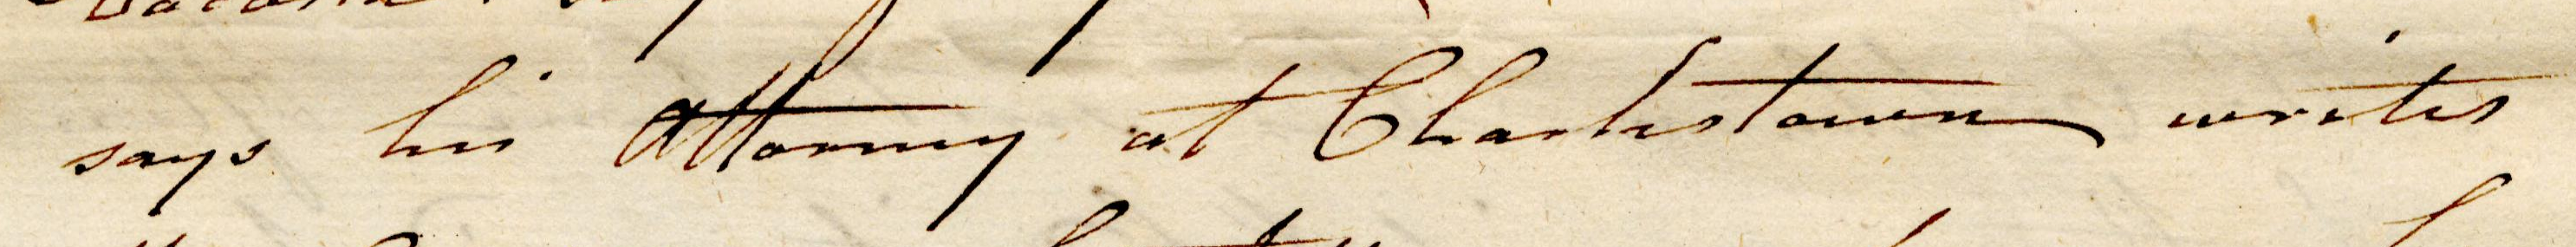says his attorney at Charlestown writes
